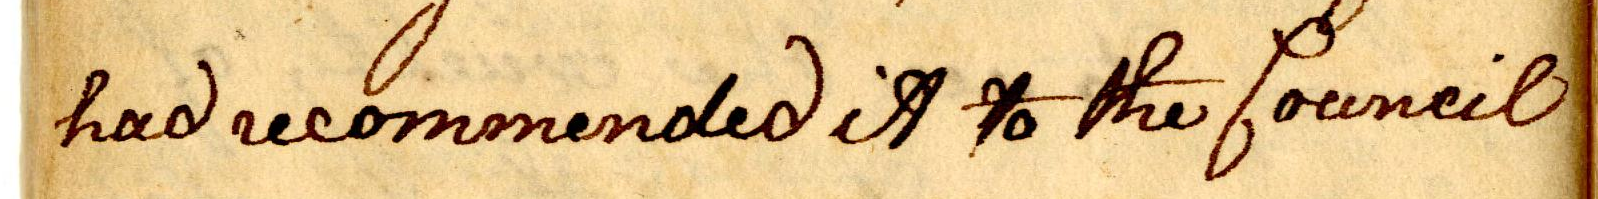had recommended it to the Council
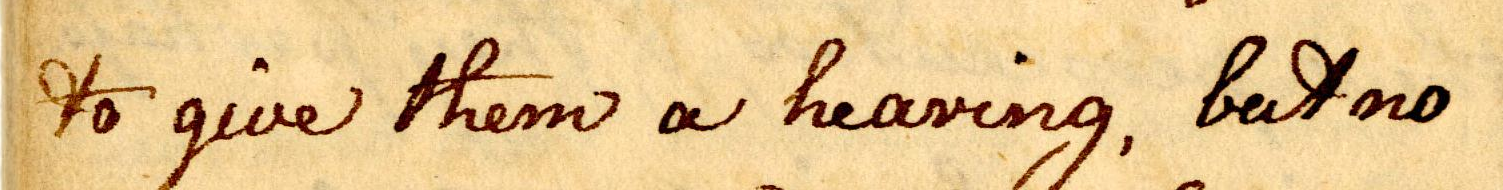to give them a hearing, but no
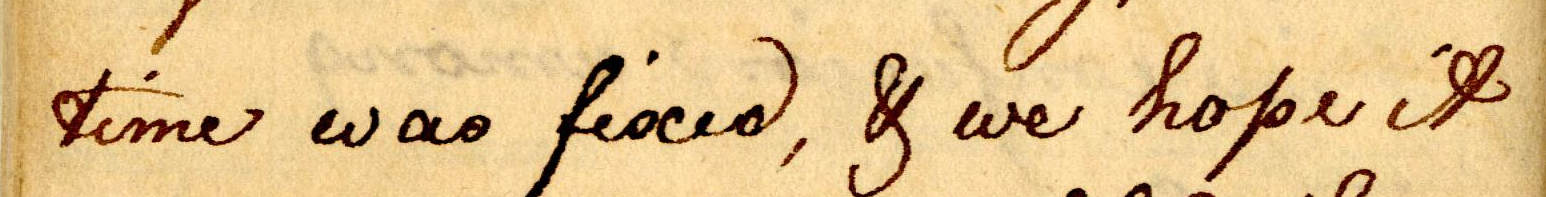time was fixed, & we hope it
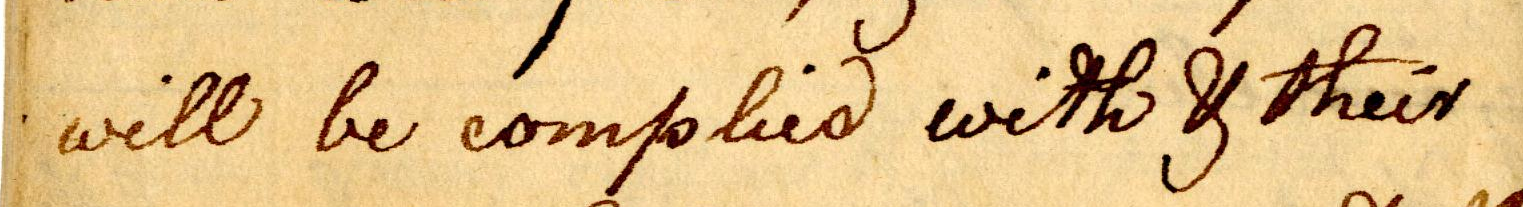will be complied with & their
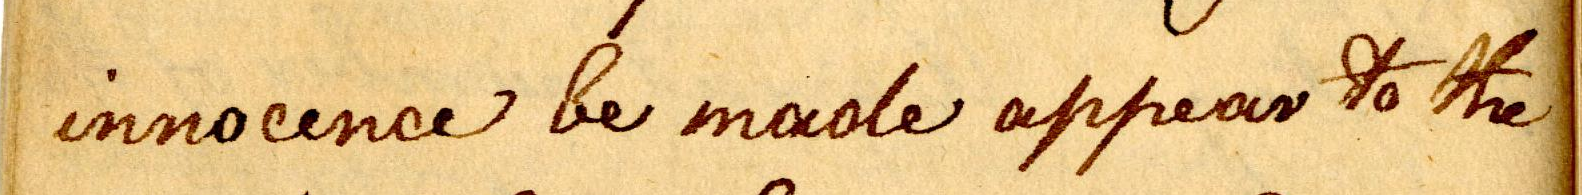innocence be made appear to the
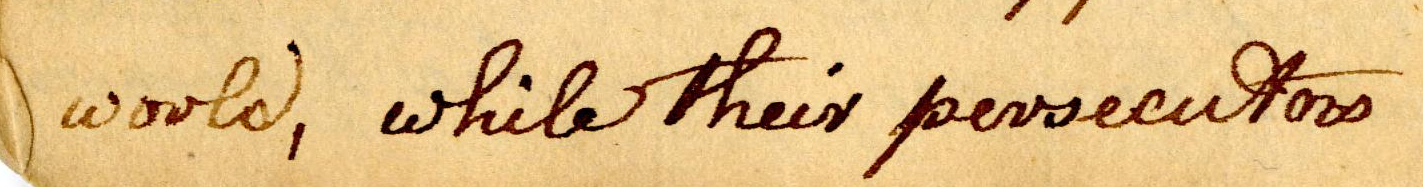world, while their persecutors
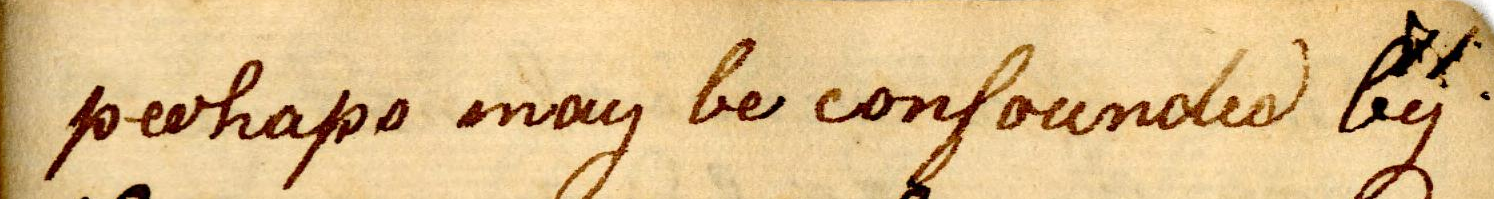perhaps may be confounded by
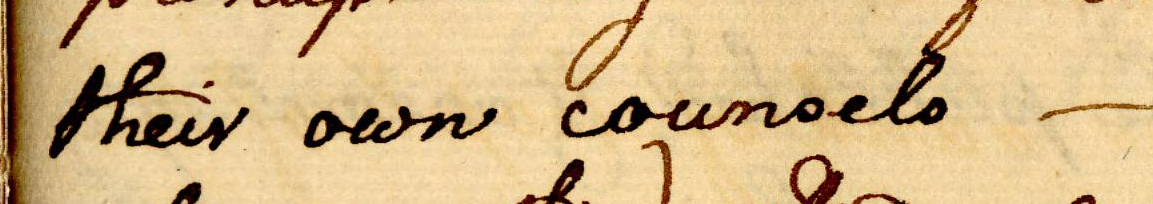their own counsels-
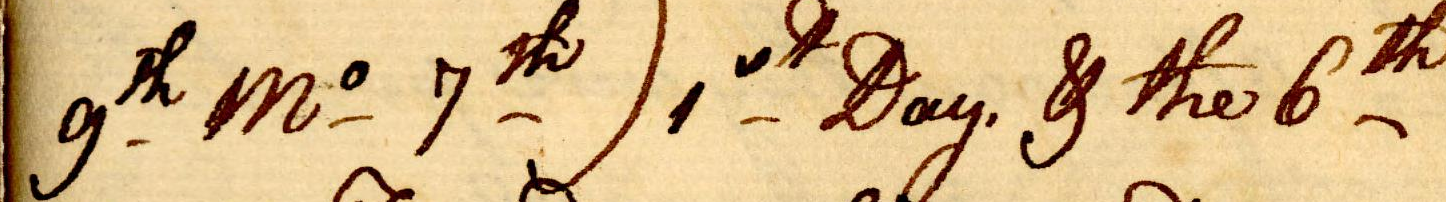9^th M^o 7^th ) 1^st Day. & the 6^th
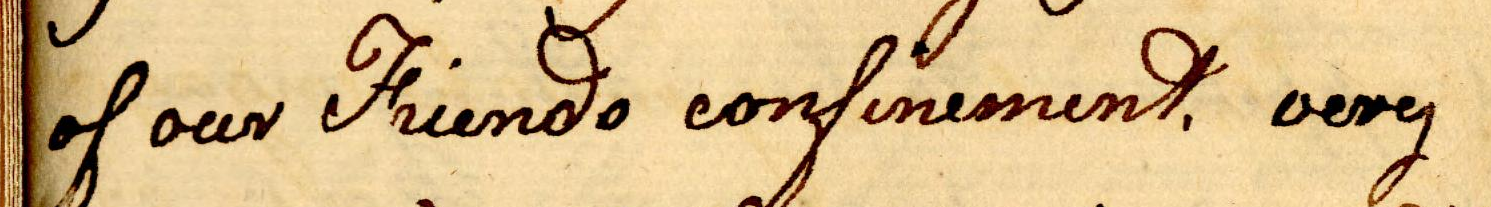of our Friends confinement. very
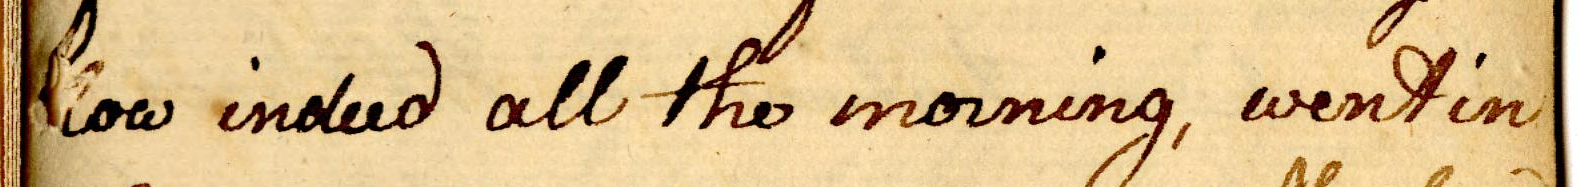low indeed all the morning, went in
